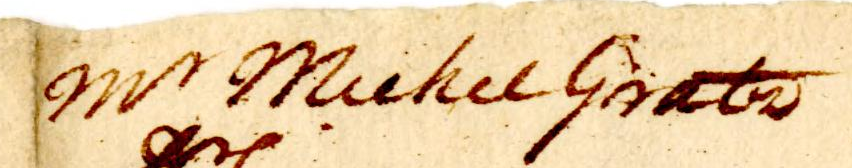M^r Michel Gratz
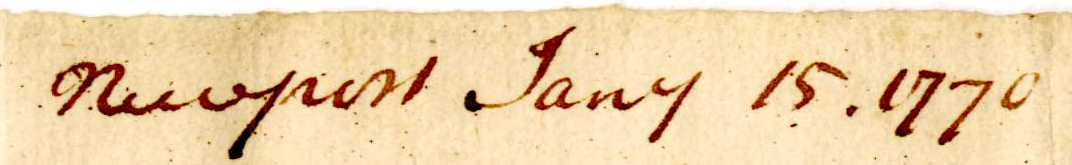Newport Jan^y 15. 1770
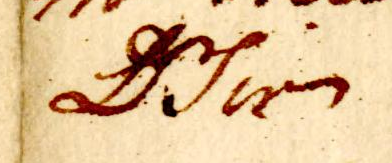D^r Sir
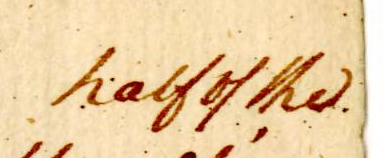half of the.
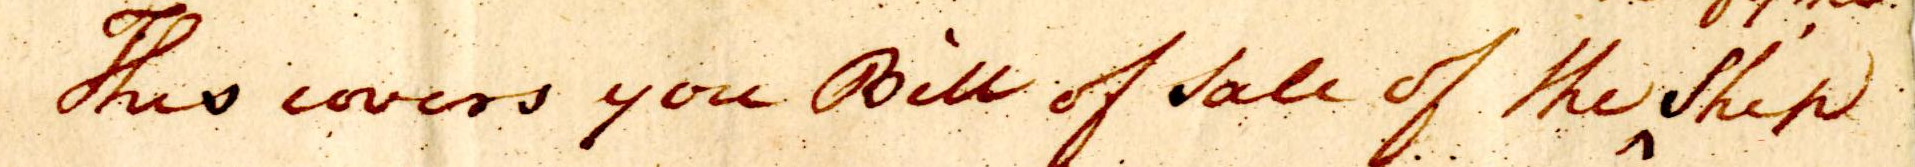this covers you Bill of Sale of the ^ ship
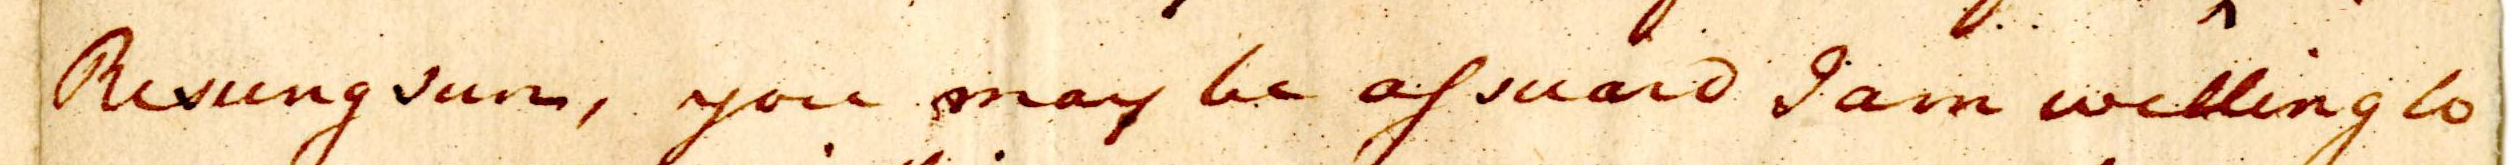Rising Sun, you may be assuard I am willing to
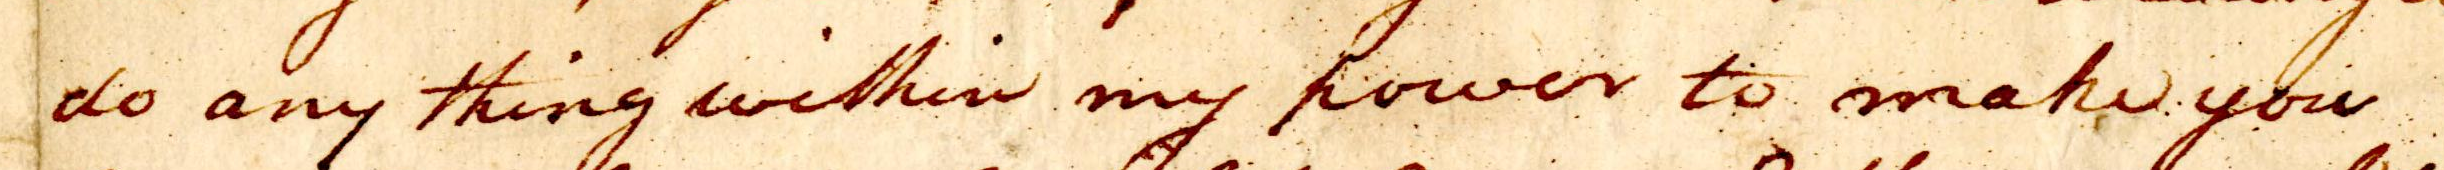do any thing within my power to make you
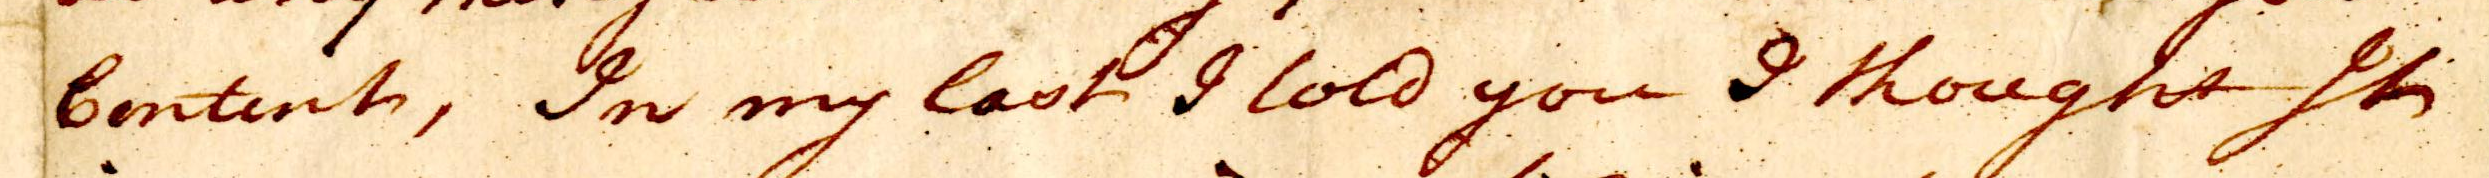Content, In my last I told you I thought It
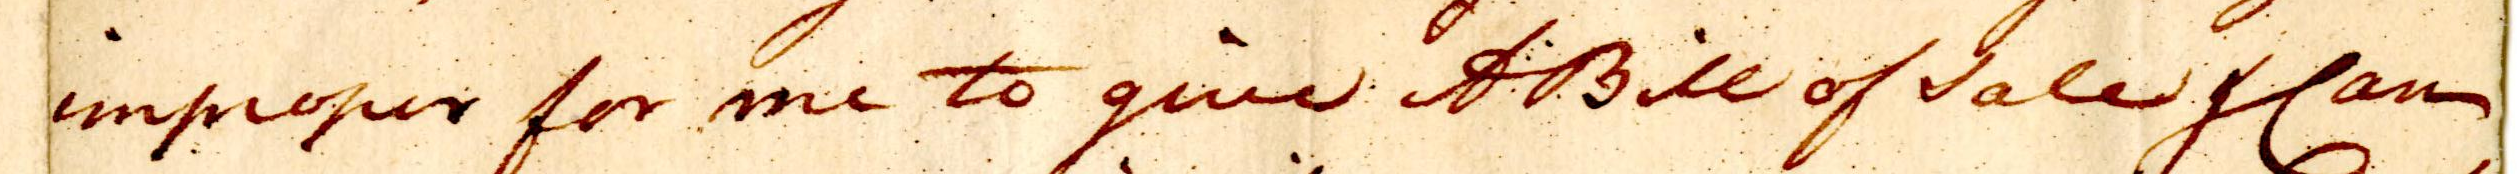improper for me to give A Bill of sale I Can
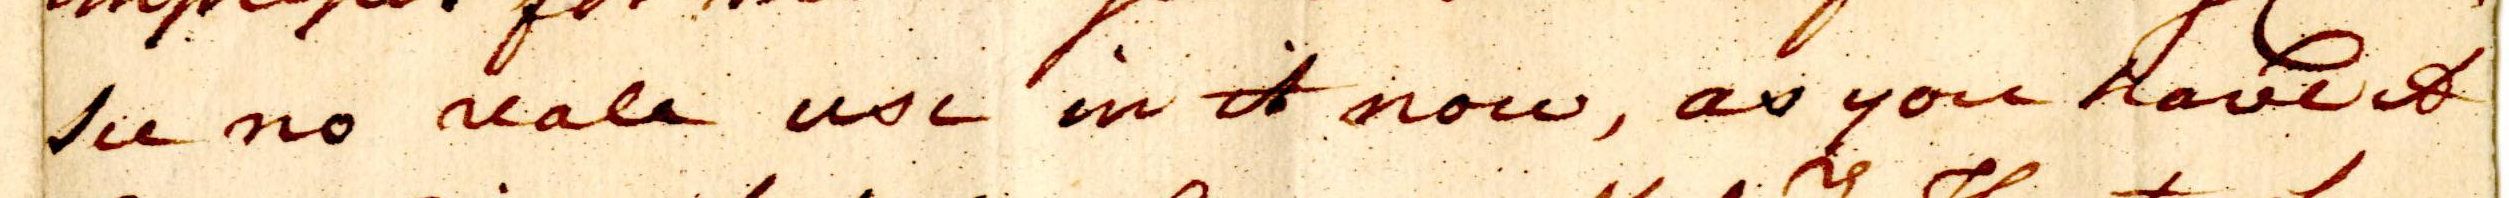see no real use in it now, as you have A
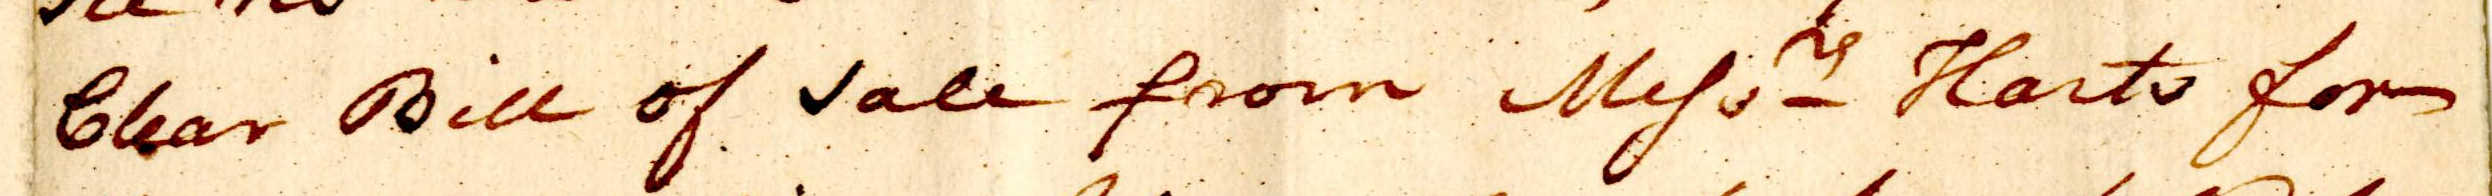Clear Bill of Sale from Mess^rs Harts for
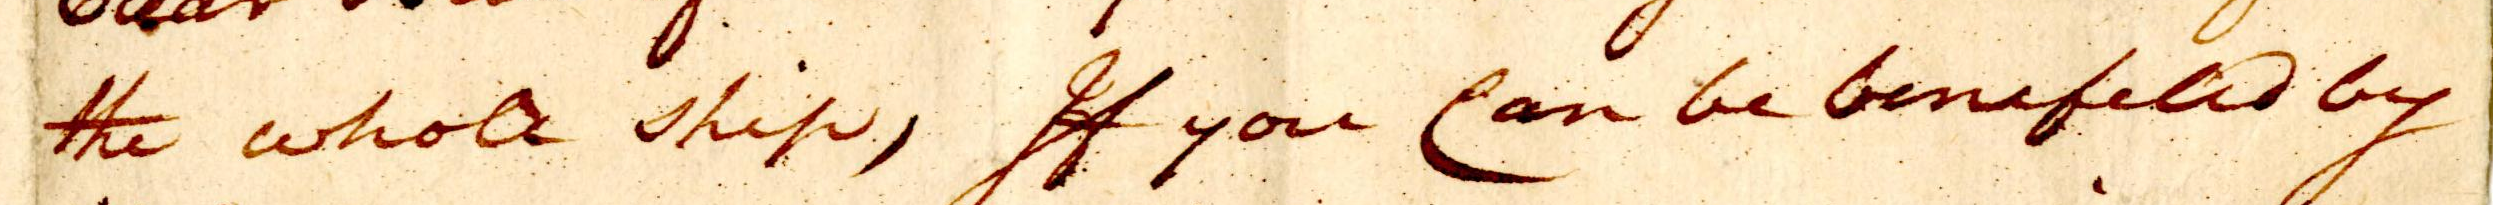the whole ship, If you Can be benefited by
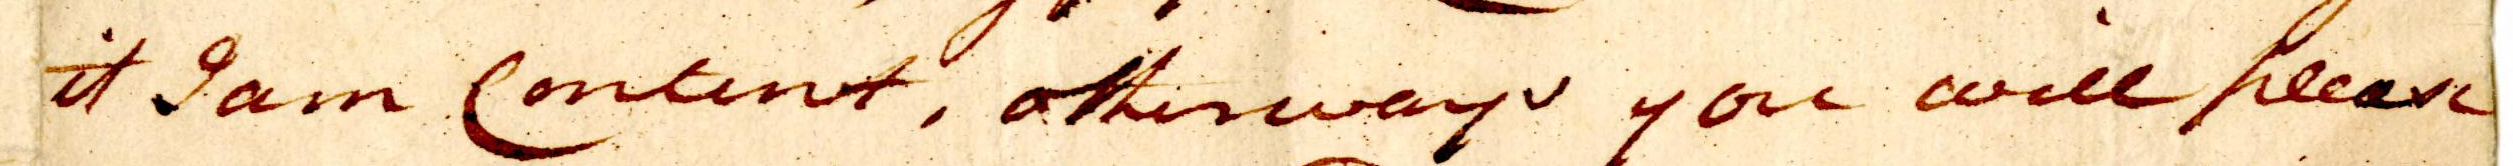it I am Content, otherways you will please
